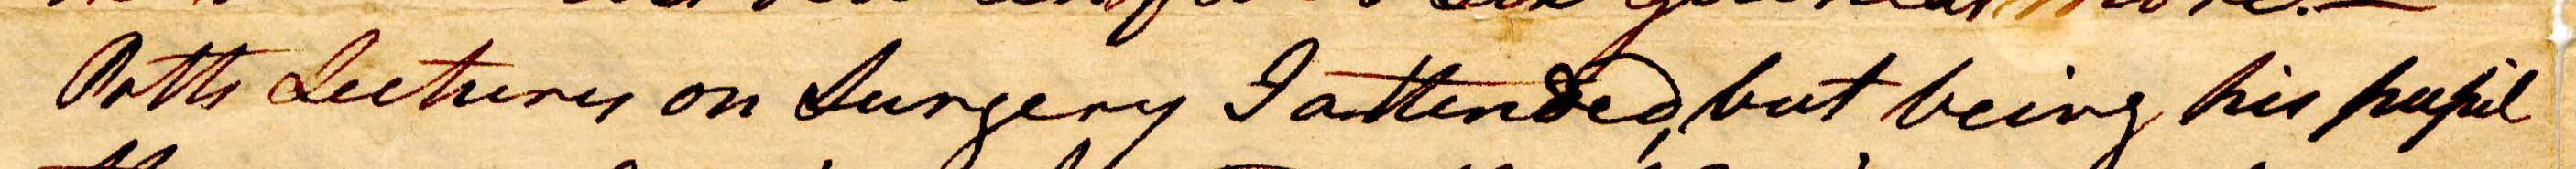Potts Lectures on Surgery I attended, but being his pupil
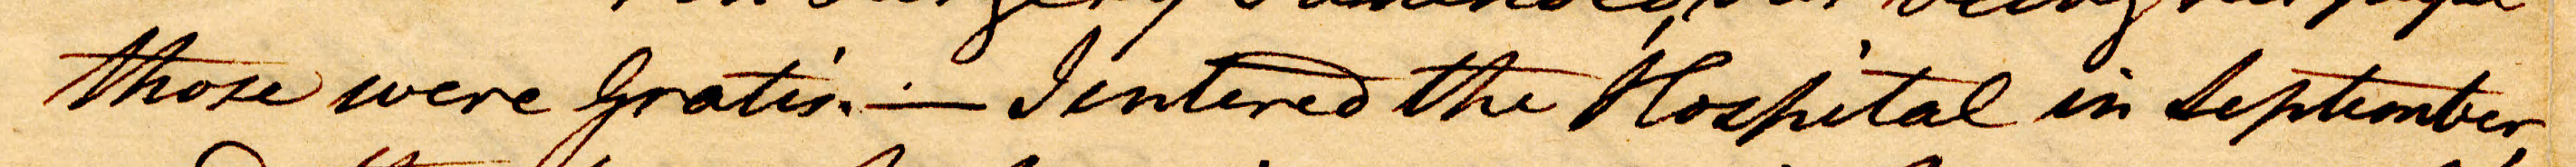those were gratis.- I entered the Hospital in September,
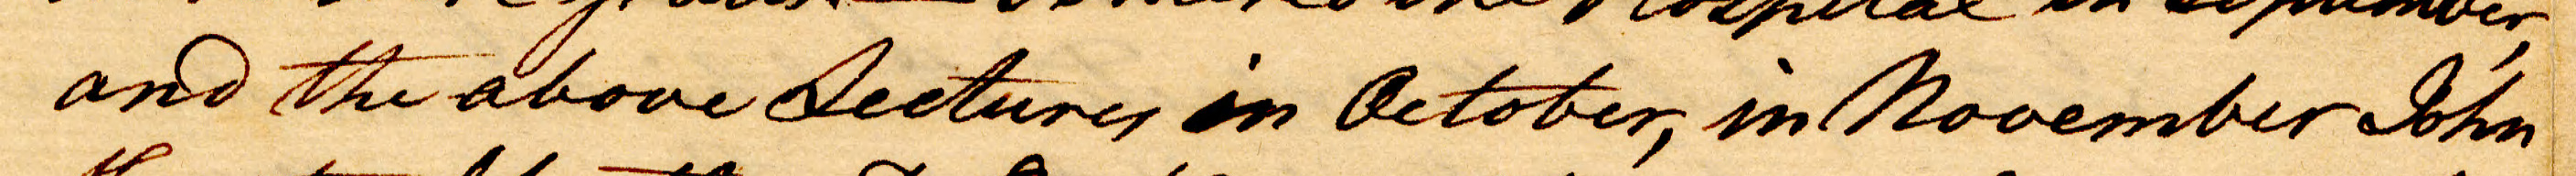and the above Lectures in October, in November John
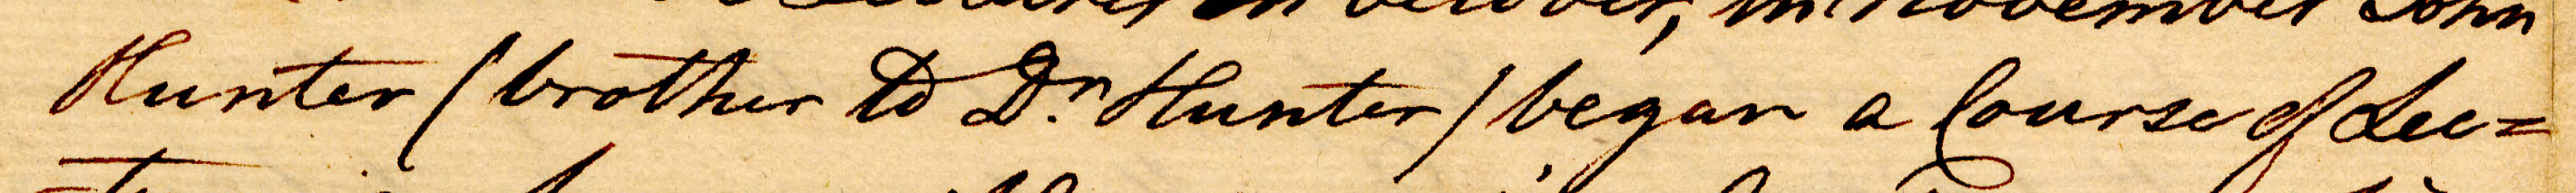Hunter (brother to D^r. Hunter) began a Course of Lec-
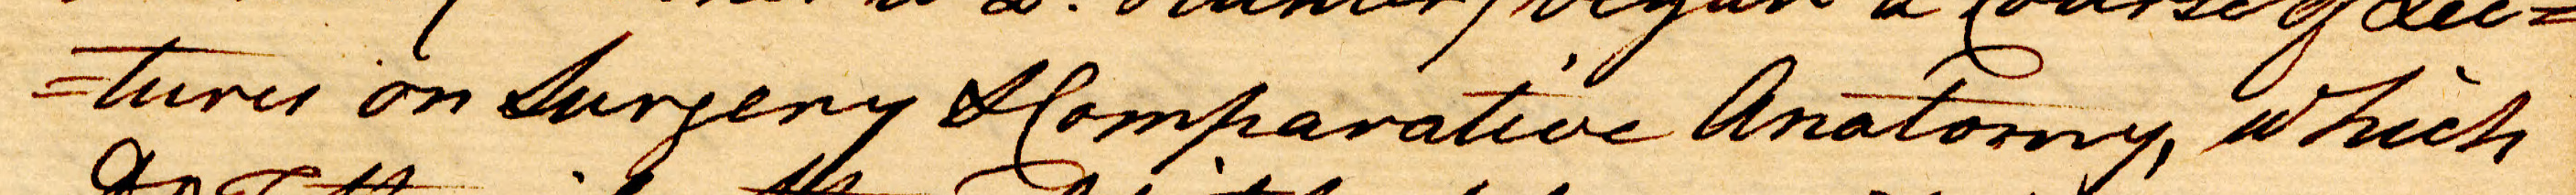-tures on Surgery & Comparative Anatomy, which
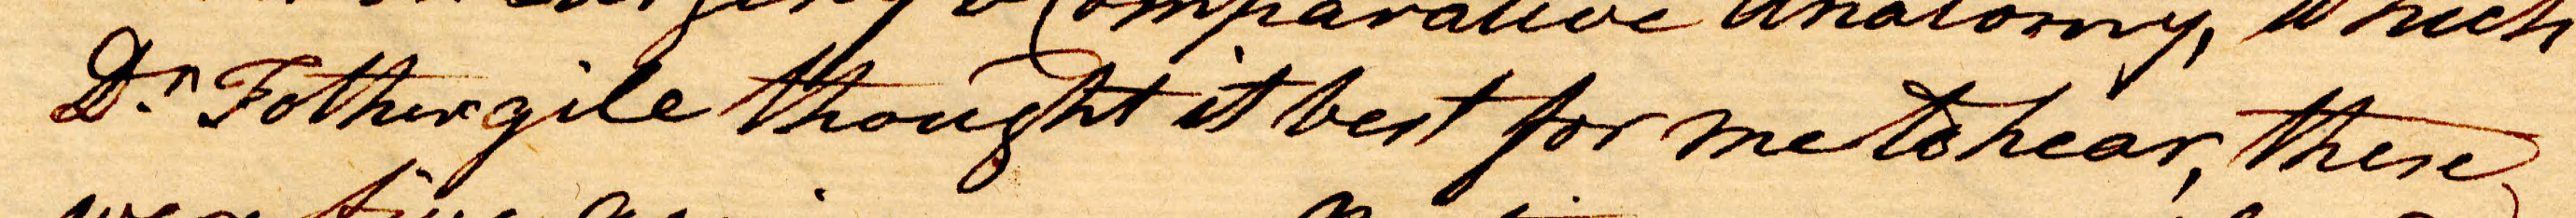D^r. Fothergill thought it best for me to hear, these
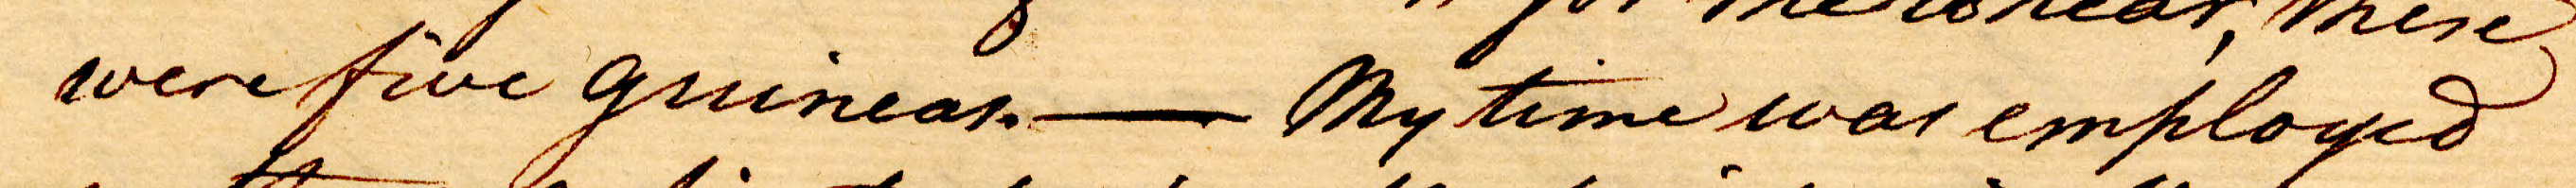were five guineas.- My time was employed
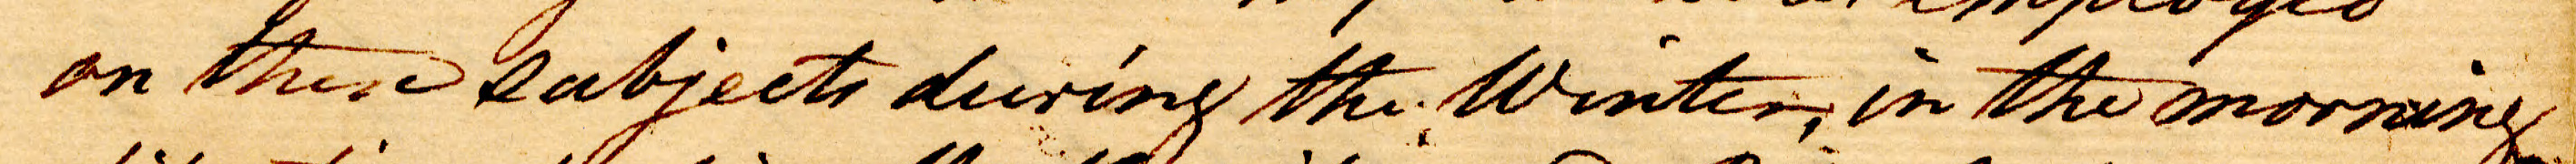on these subjects during the Winter, in the morning
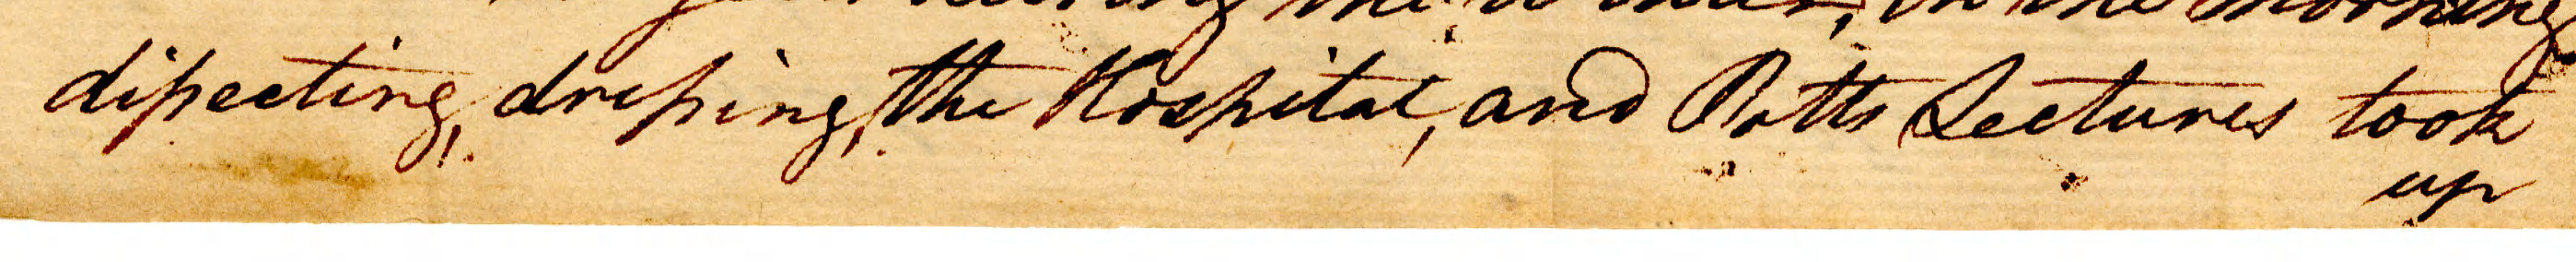dissecting, dressing, the Hospital, and Potts Lectures took
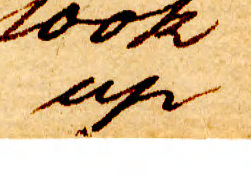up
